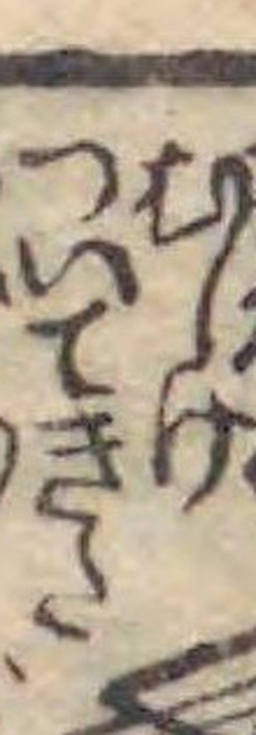ついてきた
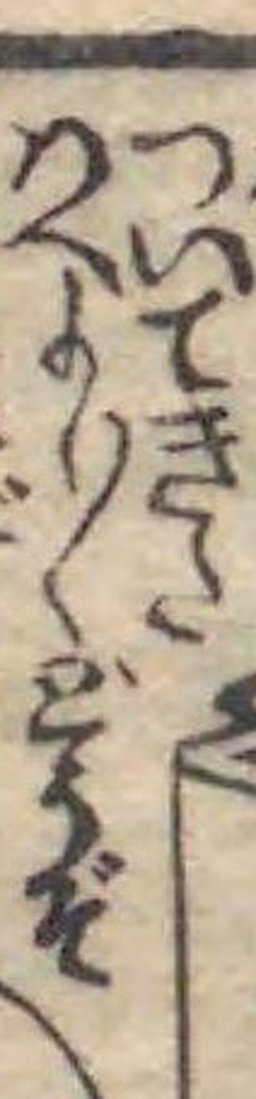はへよし〳〵どうぞ
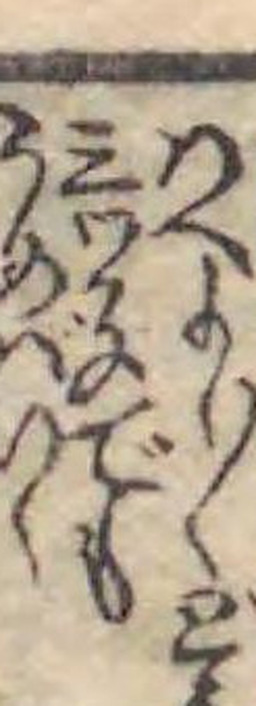三つ子でも
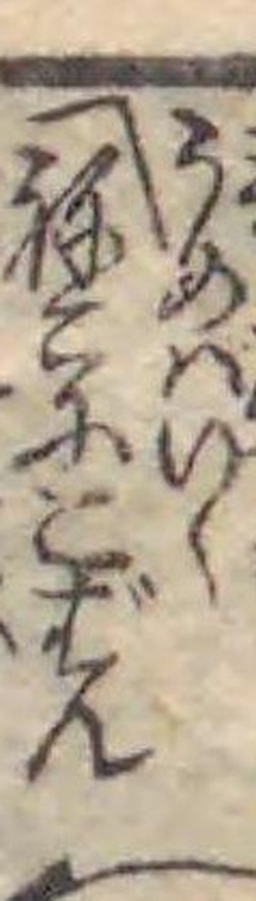〽ねこにこばん
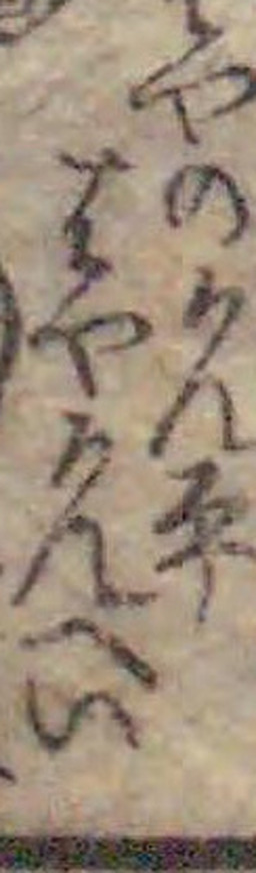はやかんへい
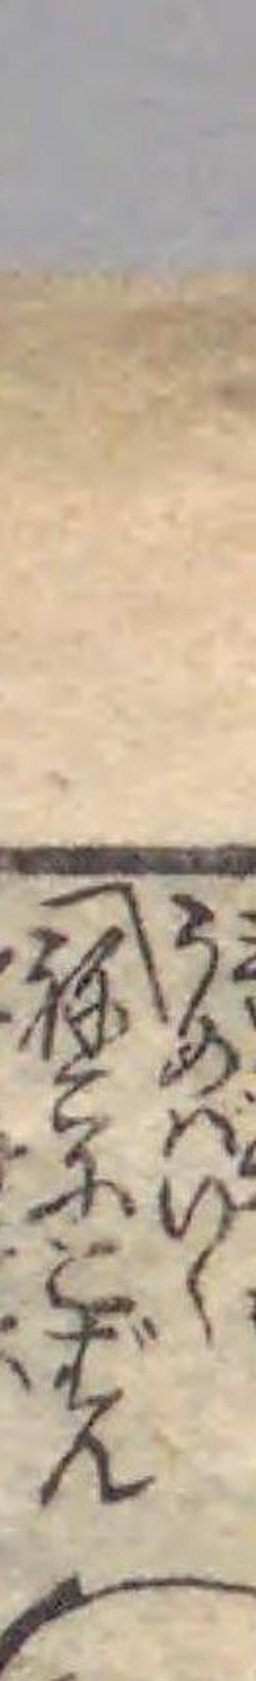〽ねこにこばん
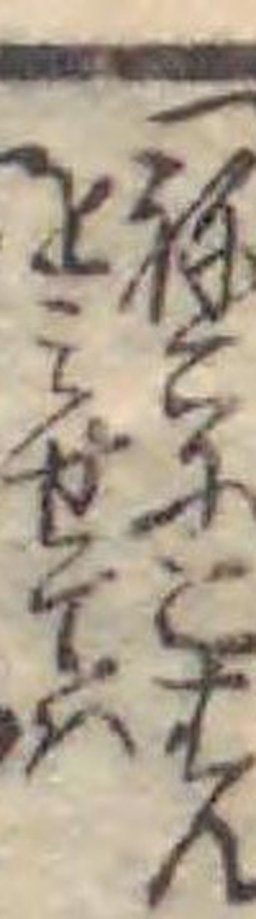をみせては
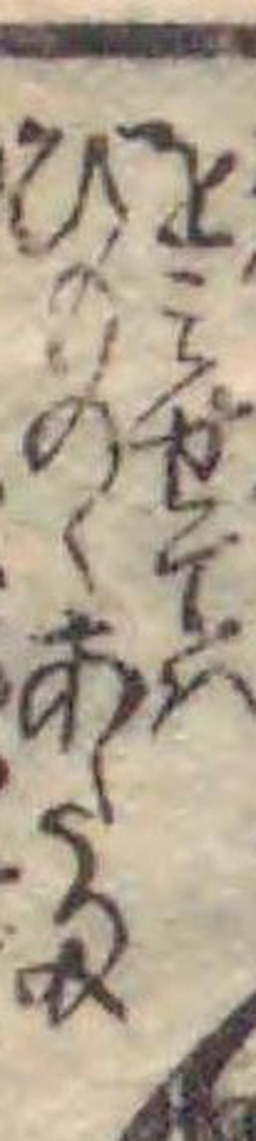ひものゝあたま
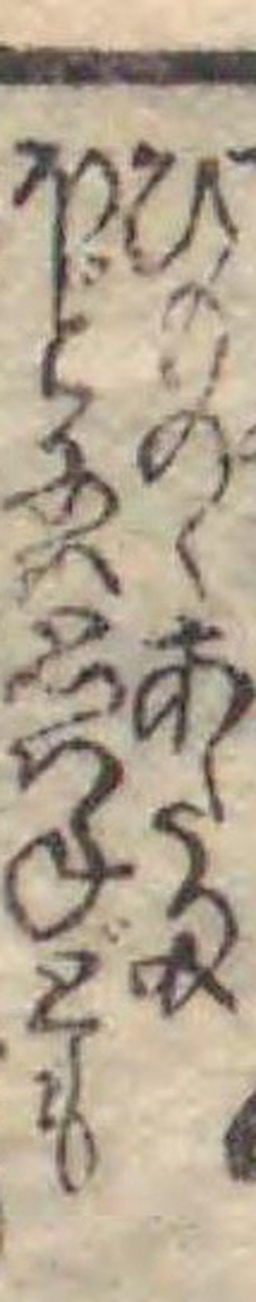ほどには思はねども
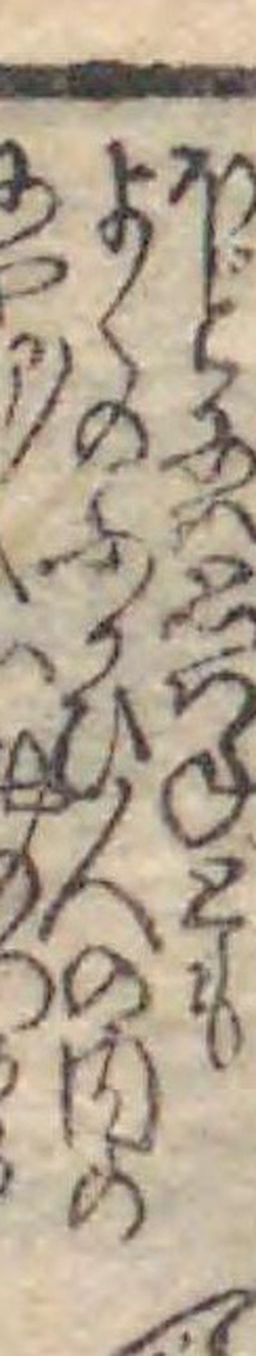よくのふかひ人の内の
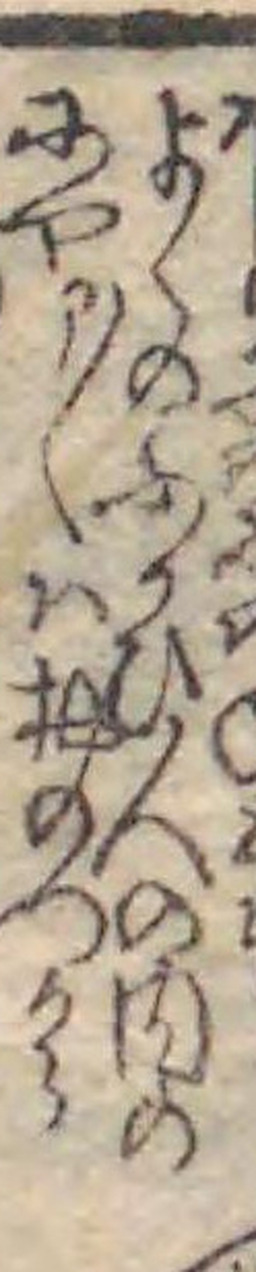にやァ〳〵はおのつから
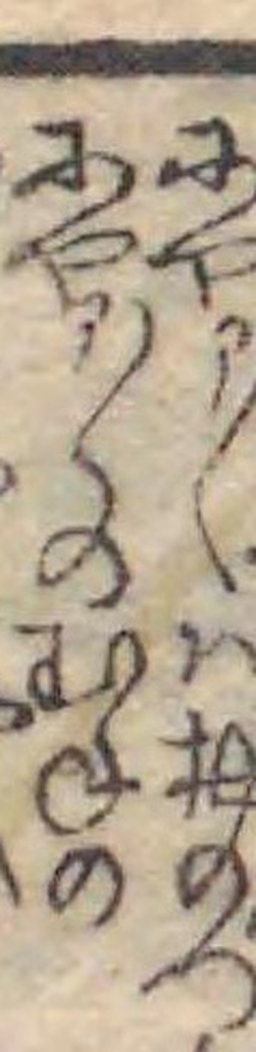にやァ〳〵のむねの
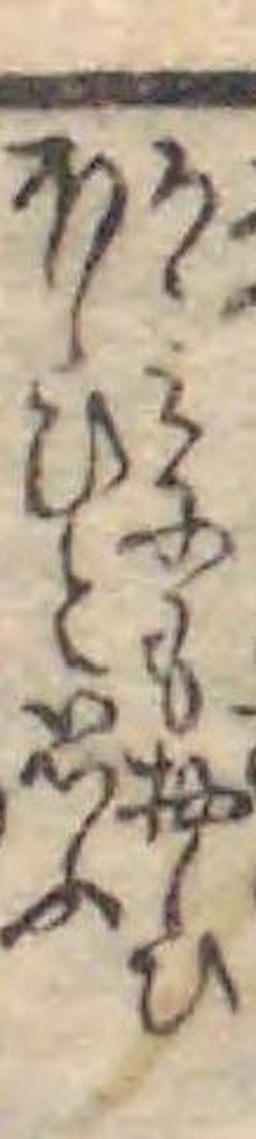ほしひと思ふ
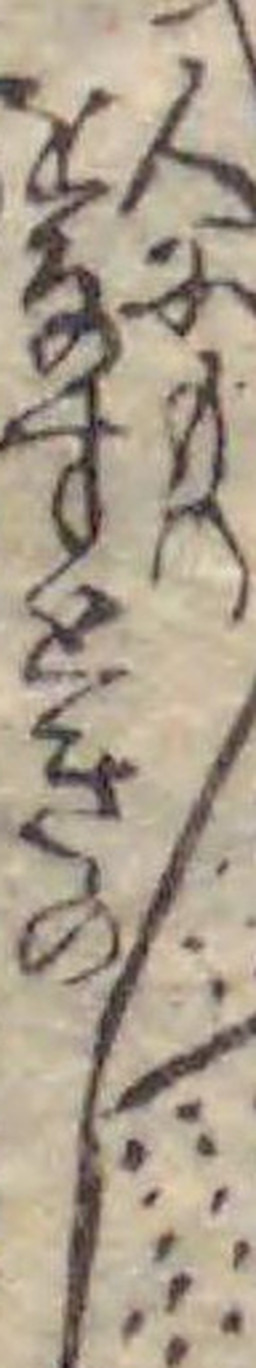をなすときの
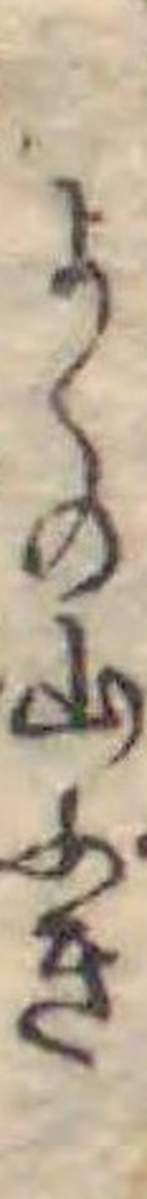よくの山ふき
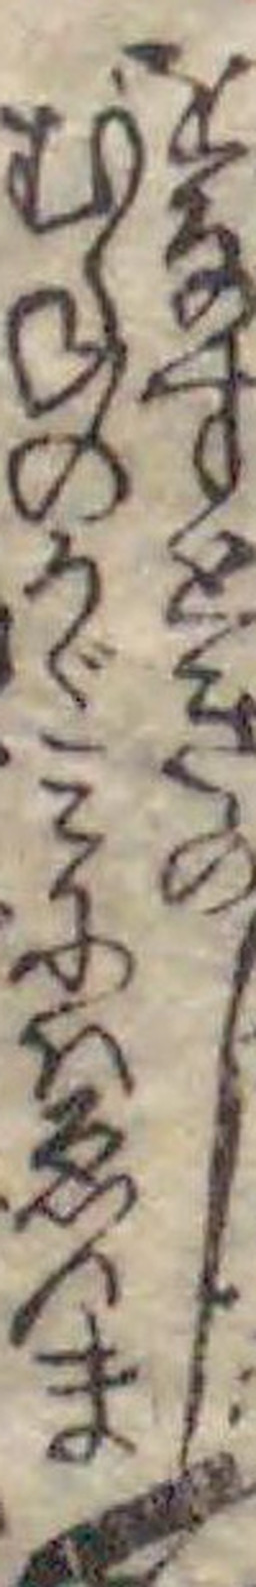むねのかゞみにはゑんま
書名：人心鏡写絵 : 3巻
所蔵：国立国会図書館 National Diet Library, JAPAN
